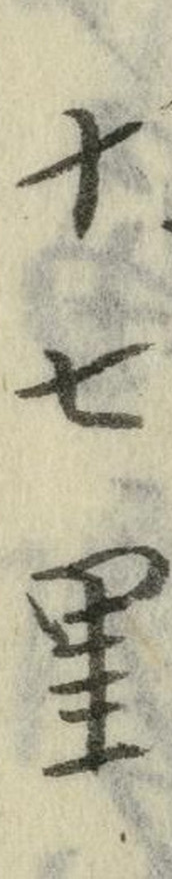十七里
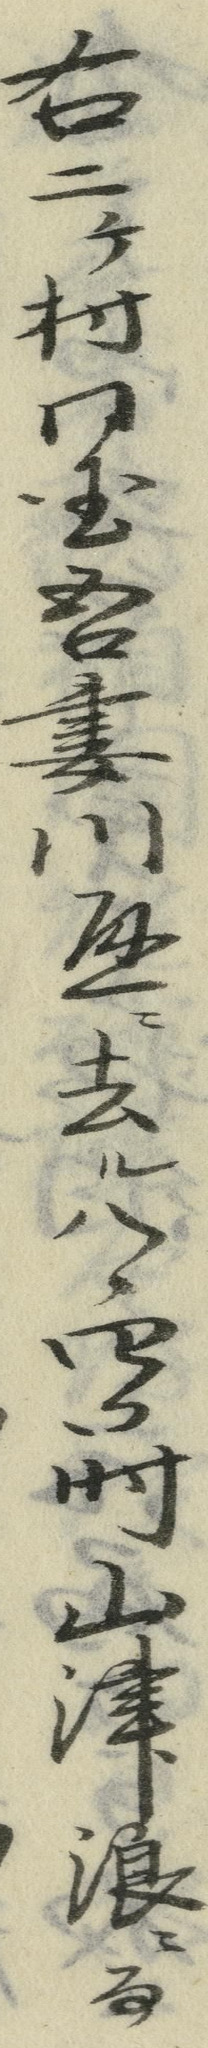右二ケ村同国吾妻川通ニ去ル八日四ツ時山津浪ニ而
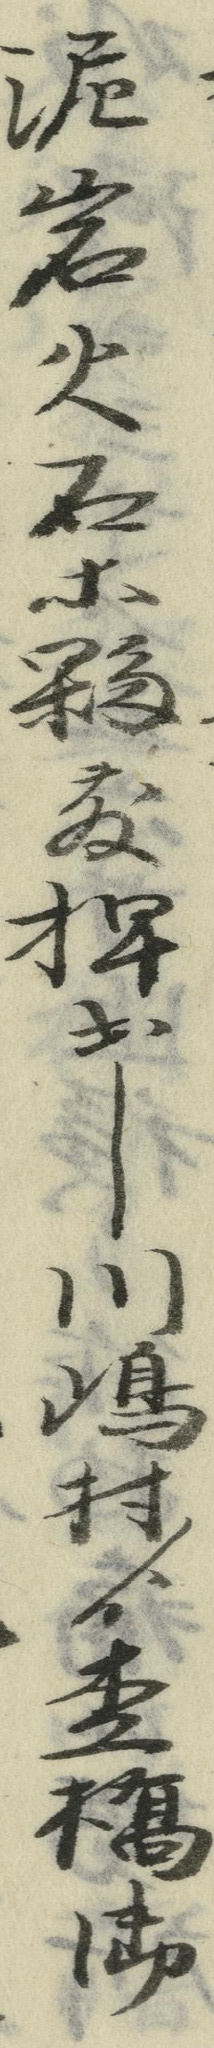泥岩火石等夥敷押出し川嶋村ゟ杢橋御
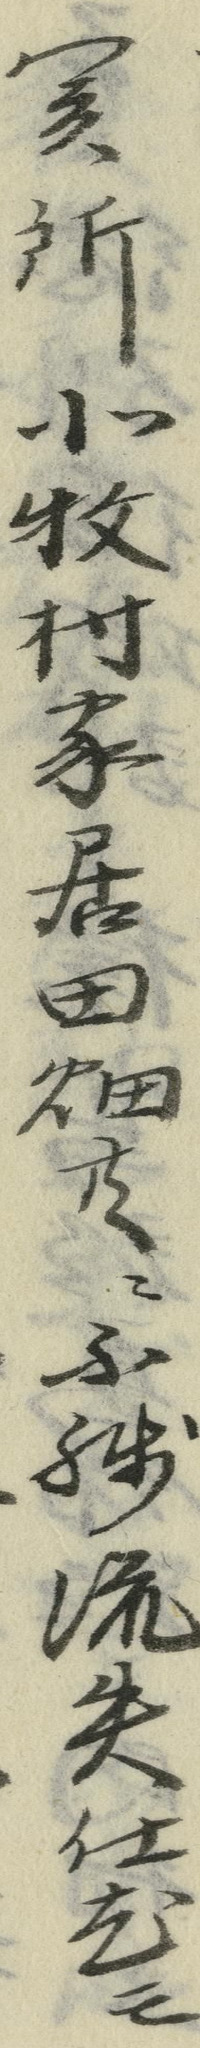関所北牧村家居田畑共ニ不残流失仕尤モ
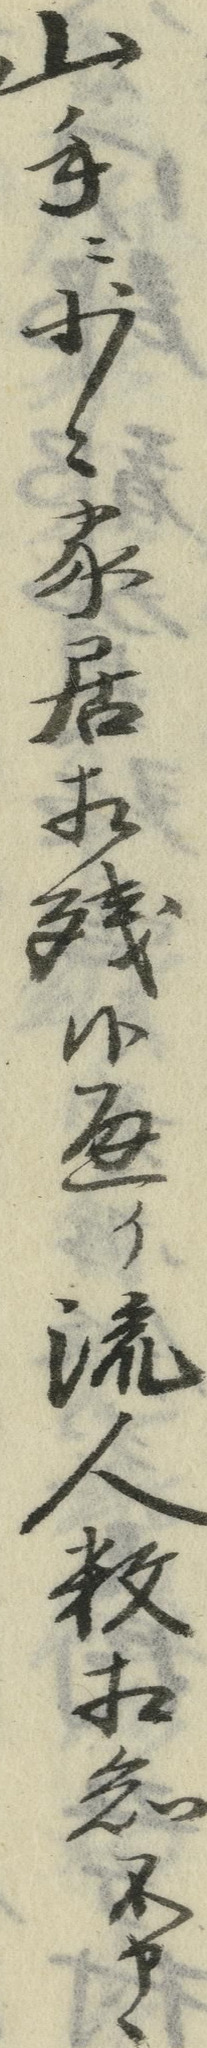山手ニ少々家居相残候通リ流人数相知不申候
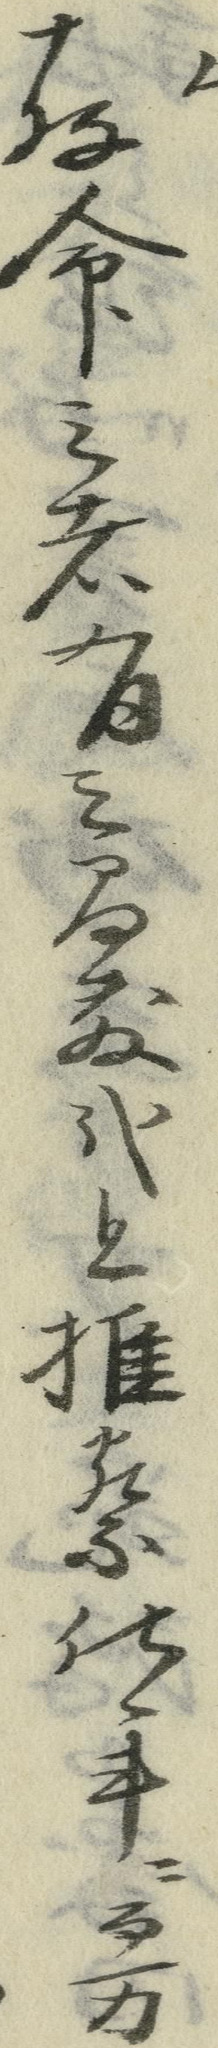存命之者有之間敷哉と推察仕候斗ニ而万
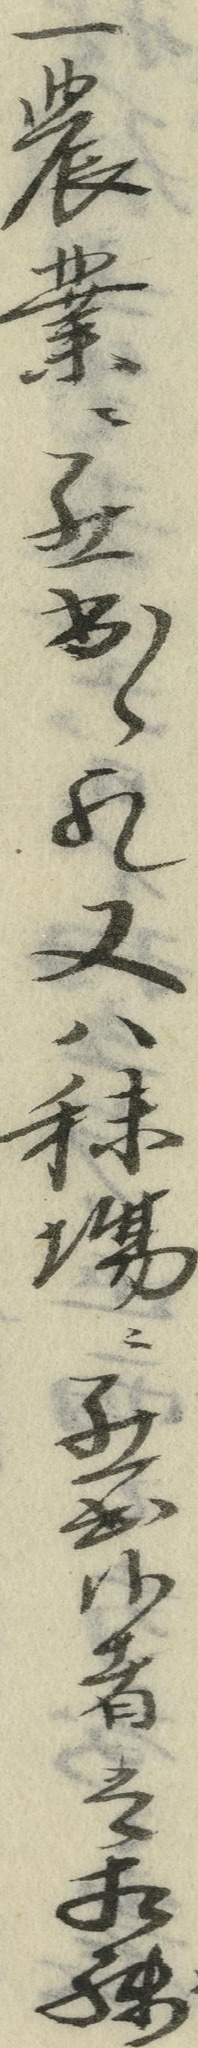一農業ニ罷出候歟又は秣場ニ罷出候者は相残
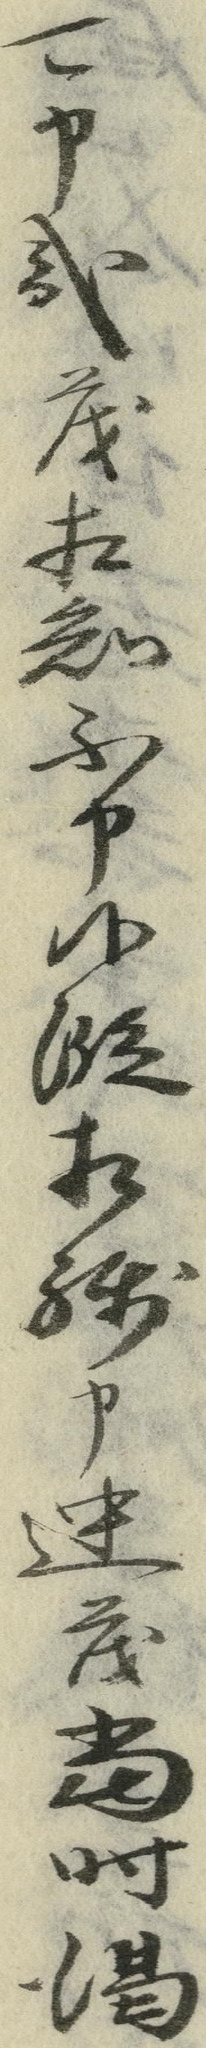可申哉茂相知不申候縦相残申迚茂当時渇
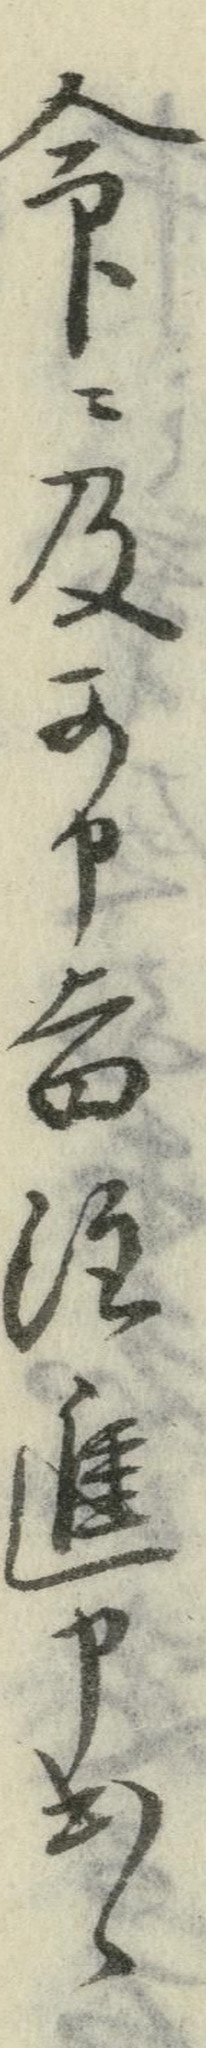命ニ及可申旨注進申出候
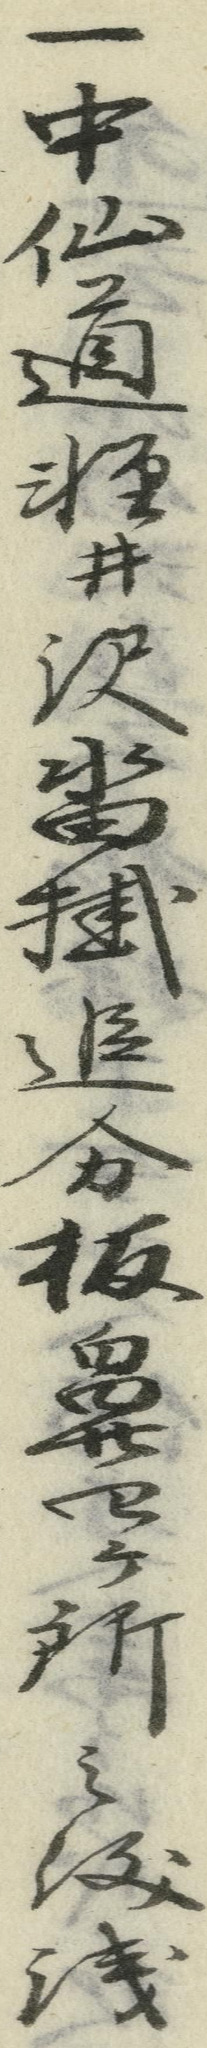一中仙道軽井沢沓掛追分板鼻四ケ所之儀浅
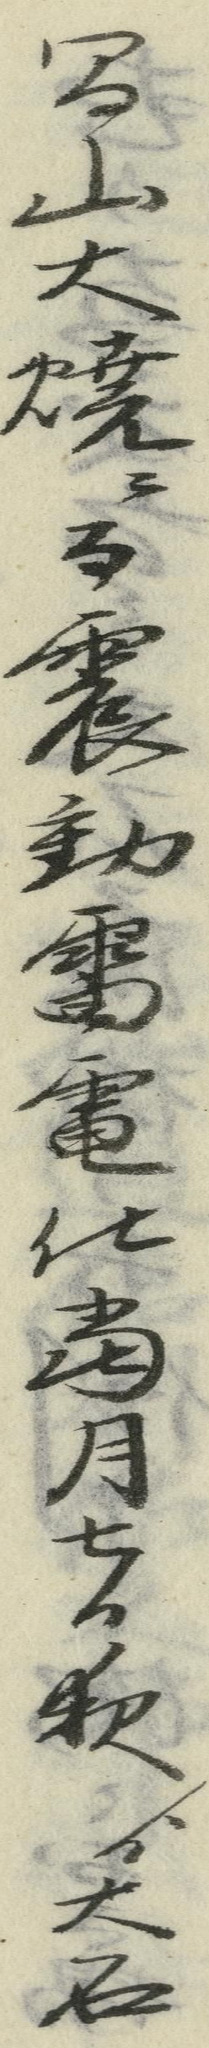間山大焼ニ而震動雷電仕当月七日夜ゟ大石
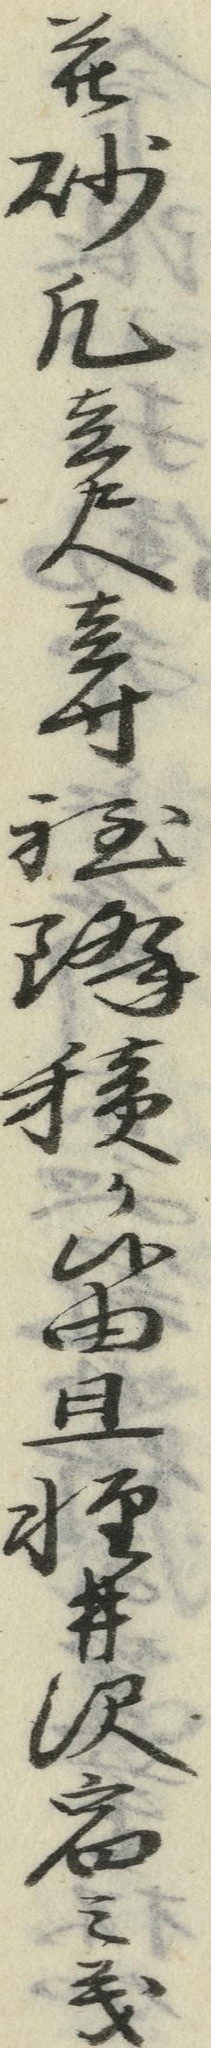并砂凡壱尺壱寸程降積リ候由且軽井沢宿之義
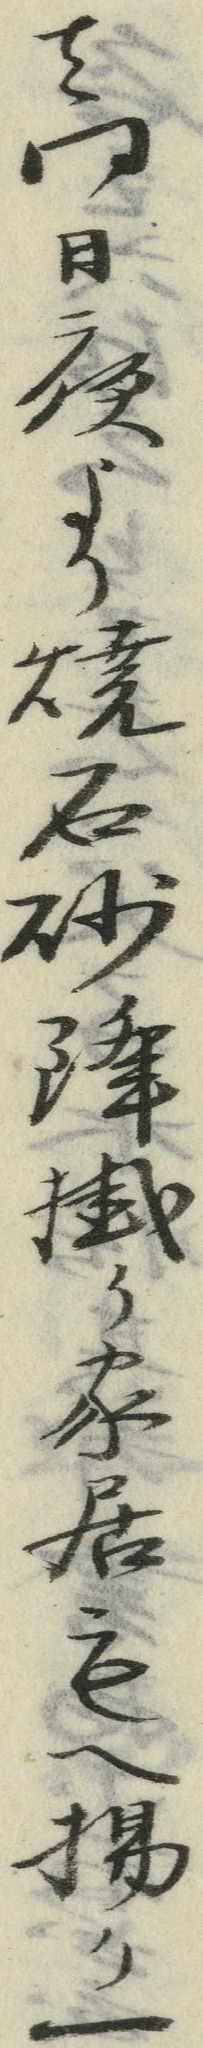は同日夜より焼石砂降掛リ家居毛へ揚リ一
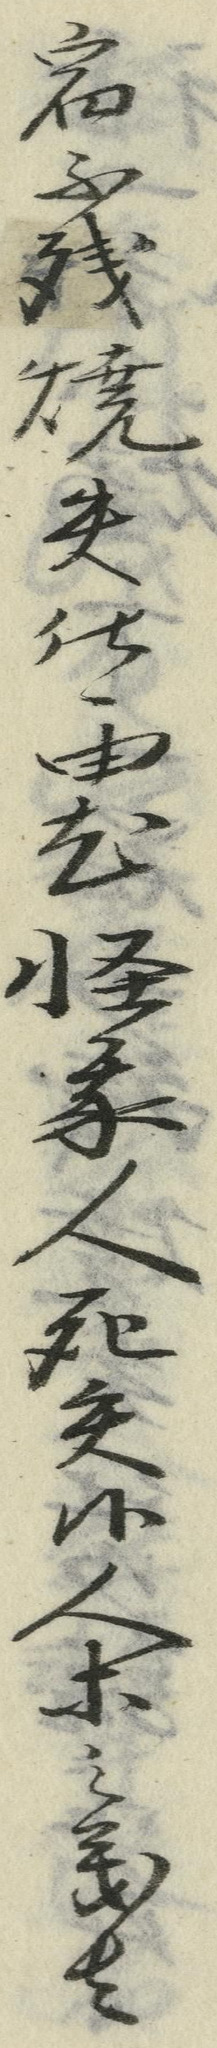宿不残焼失仕候由尤怪家人死失候人等之義は
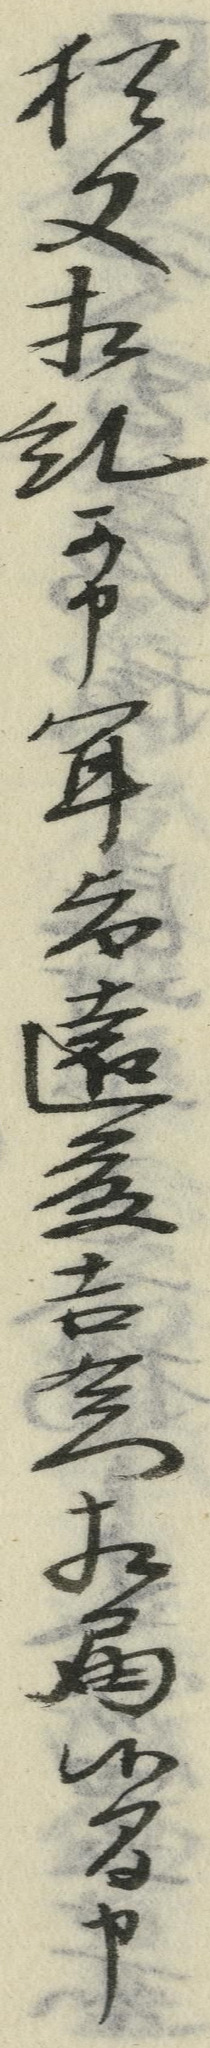猶又相糺可申聞旨遠藤吉右衛門相届候間申
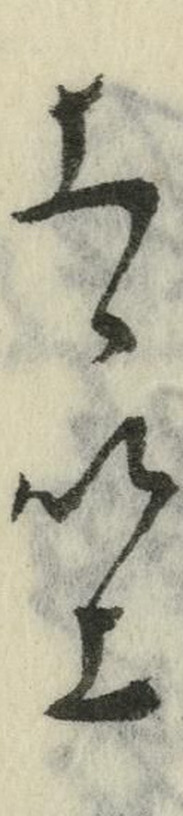上候以上
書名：天明三癸卯七月信州浅間山焼出シ上州山津浪ニ付近國ヨリ御届書并訴書写
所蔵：東京大学地震研究所図書室 Earthquake Research Institute Library, The University of Tokyo, JAPAN
